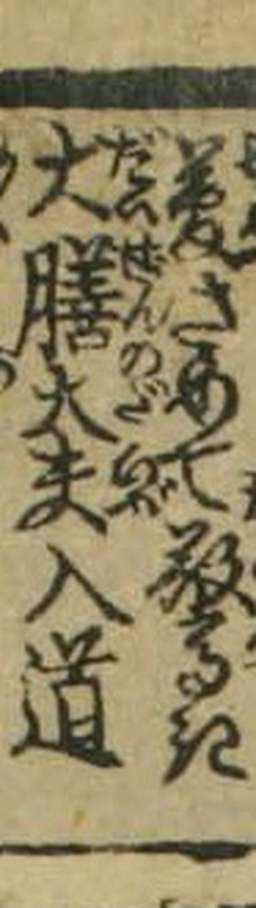大膳大夫入道
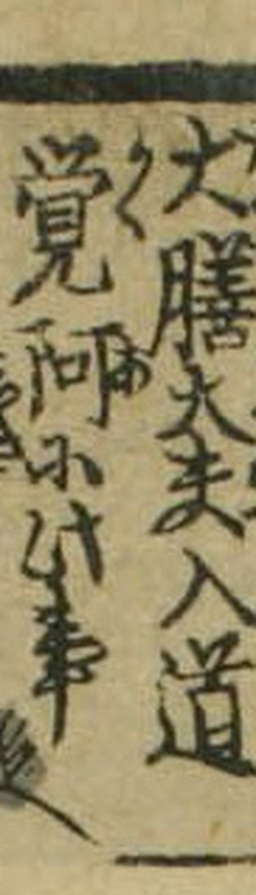覚阿に此事
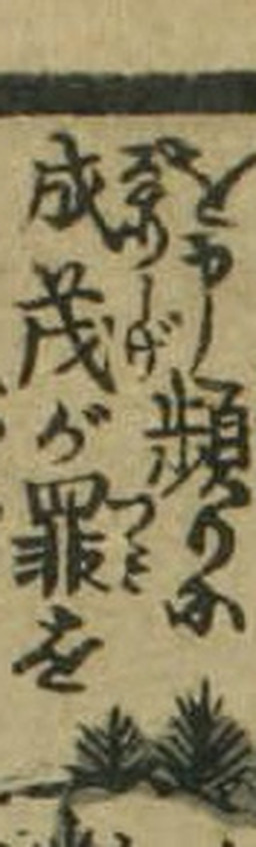成茂が罪を
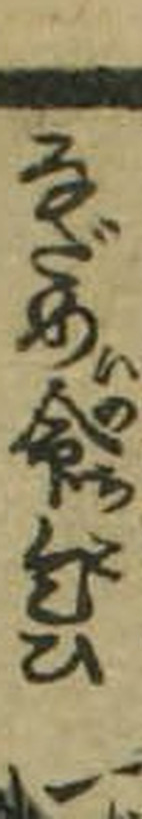なだめ命乞ひ
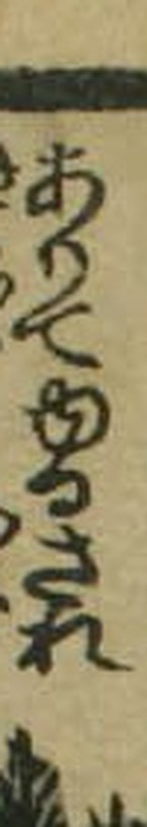ありてゆるされ
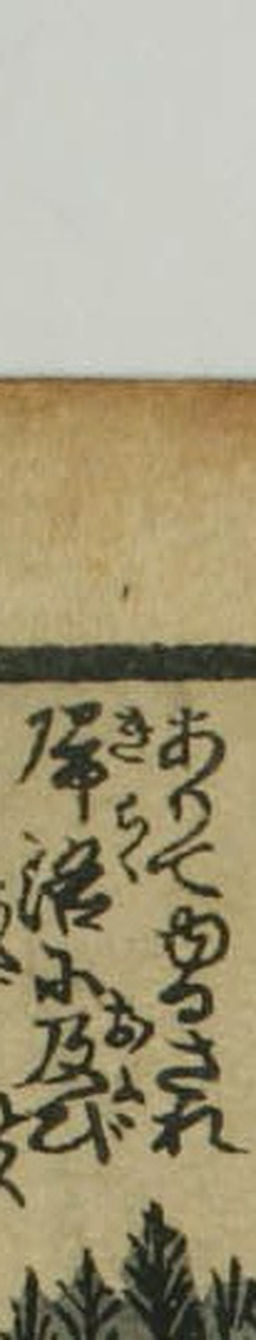帰洛に及び
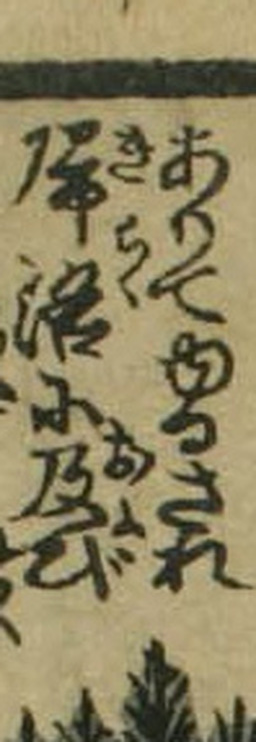帰洛に及び
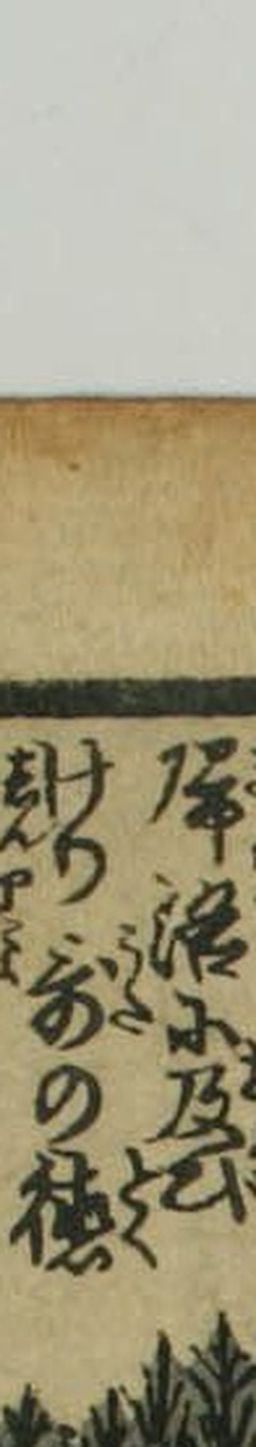けり哥の徳
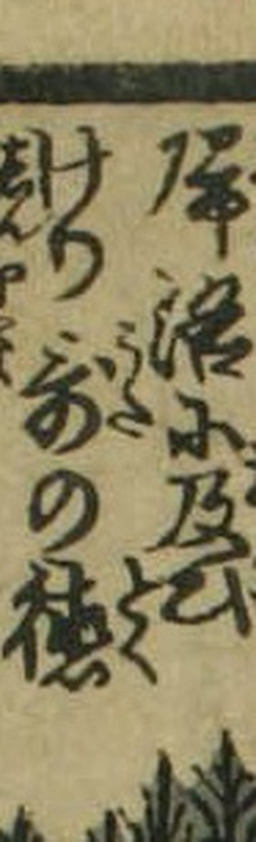けり哥の徳
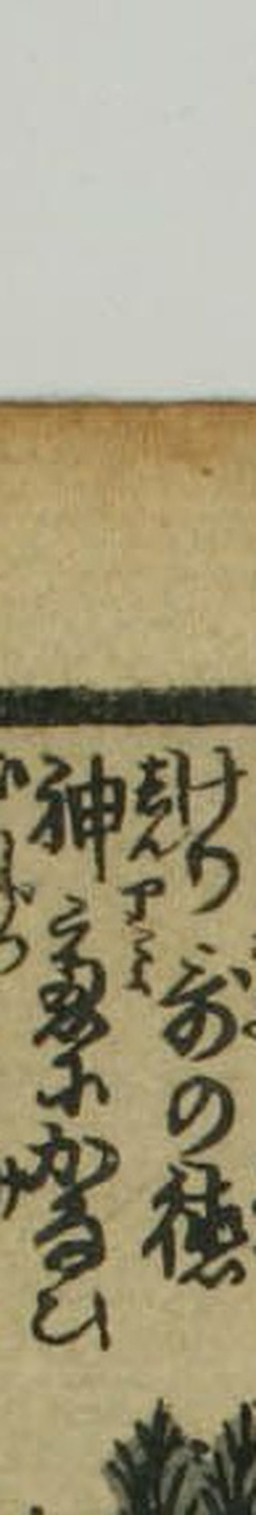神慮にかなひ
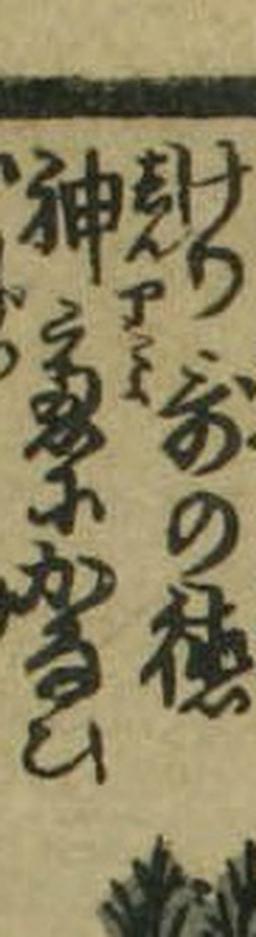神慮にかなひ
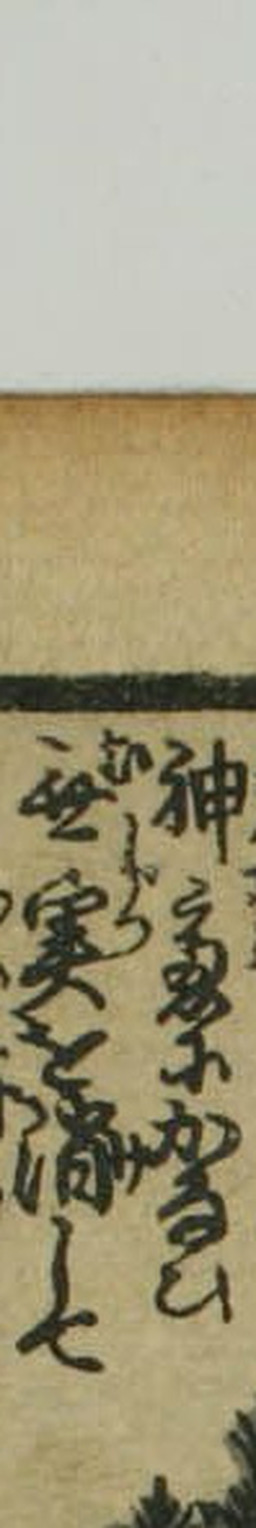無実を消して
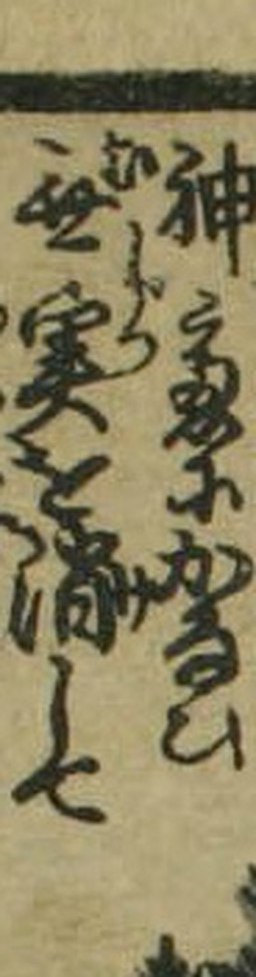無実を消して
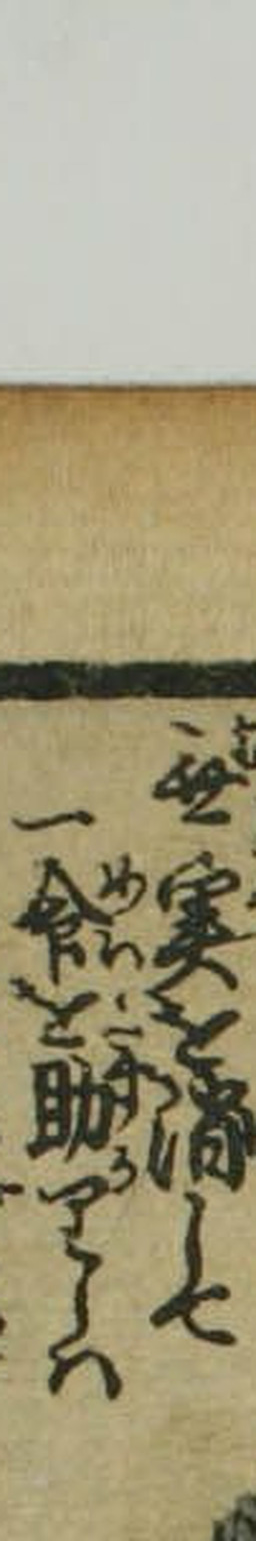一命を助りしは
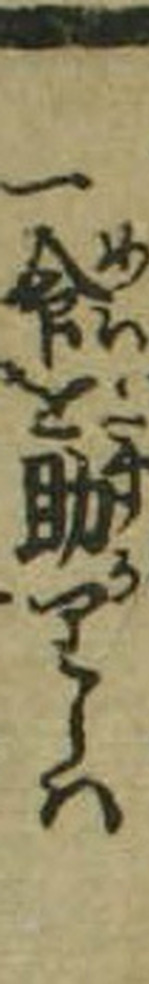一命を助りしは
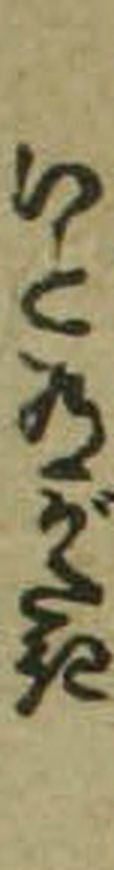いと有がたき
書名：續英雄百人一首
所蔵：東京学芸大学附属図書館
